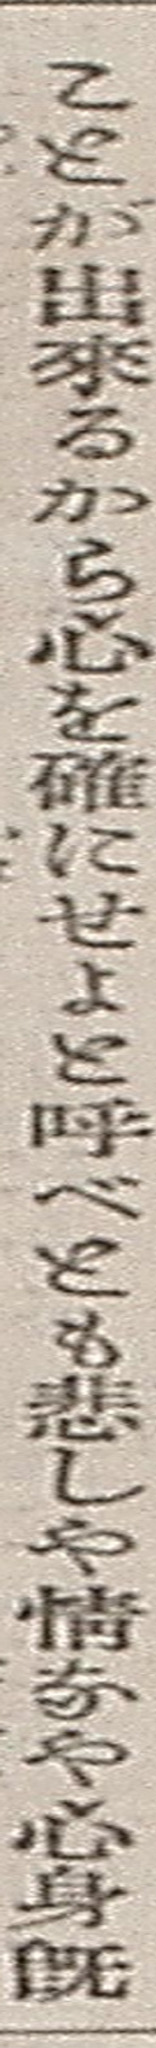ことが出来るから心を確にせよと呼べとも悲しや情なや心身既
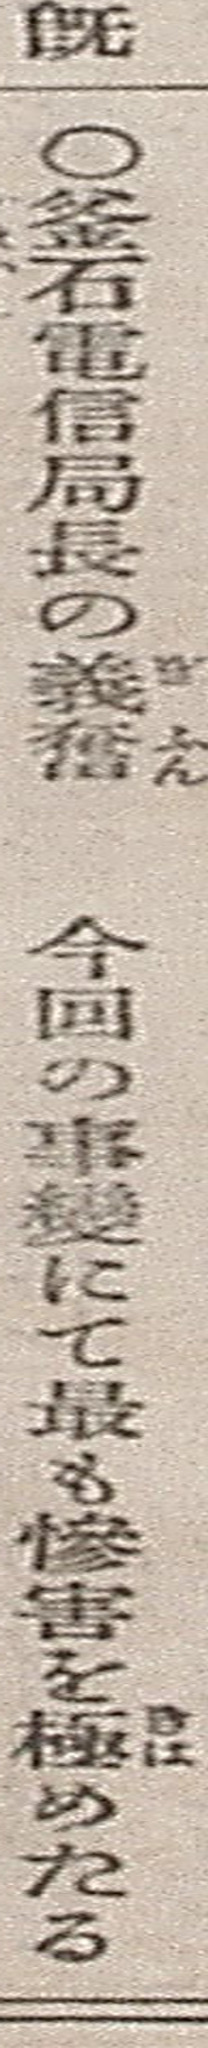○釜石電信局長の義奮今回の時変にて最も惨害を極めたる
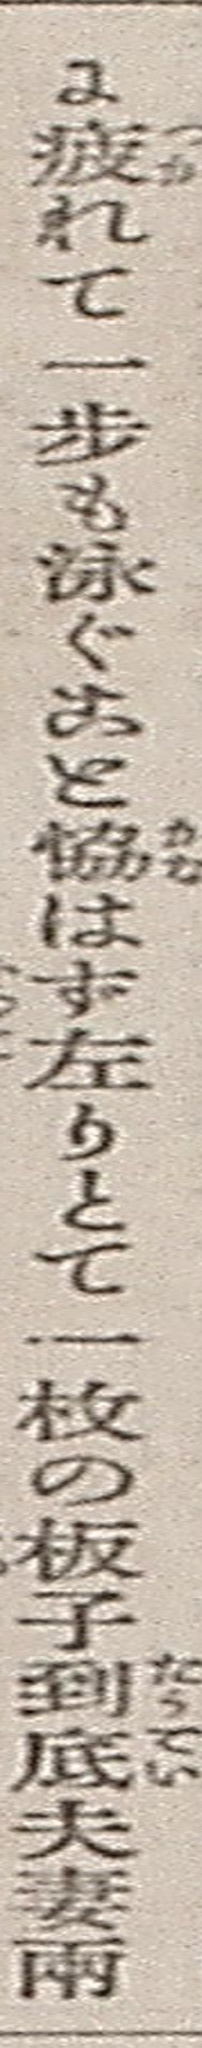に疲れて一歩も泳ぐこと協はず左りとて一枚の板子到底夫妻両
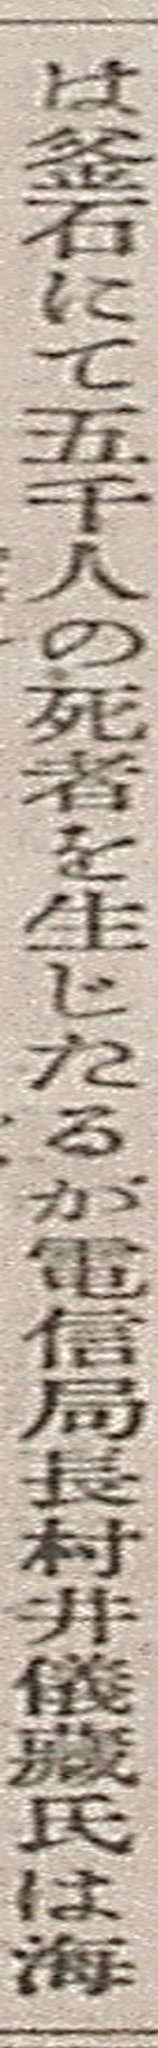は釜石にて五千人の死者を生じたるが電信局長村井儀蔵氏は海
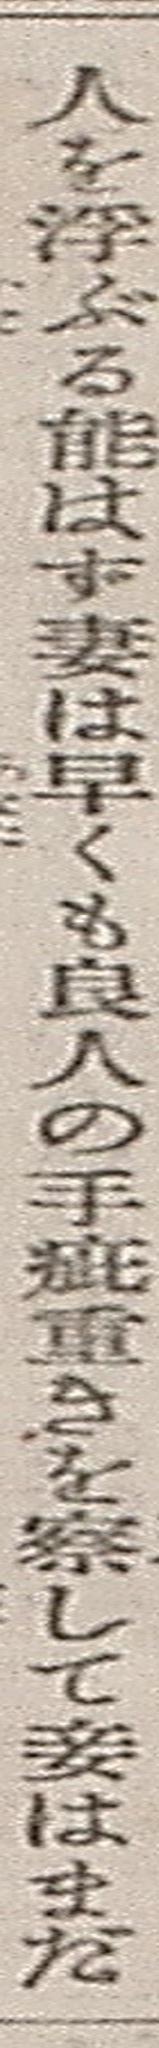人を浮ぶる能はず妻は早くも良人の手疵重きを察して妾はまだ
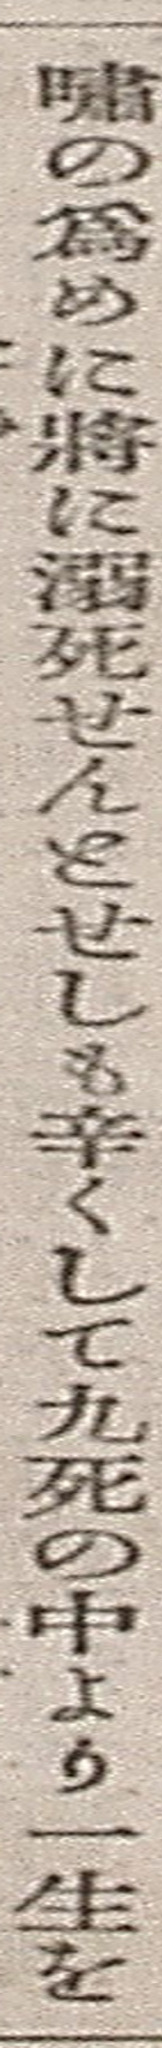嘯の為めに将に溺死せんとしも辛くして九死の中より一生を
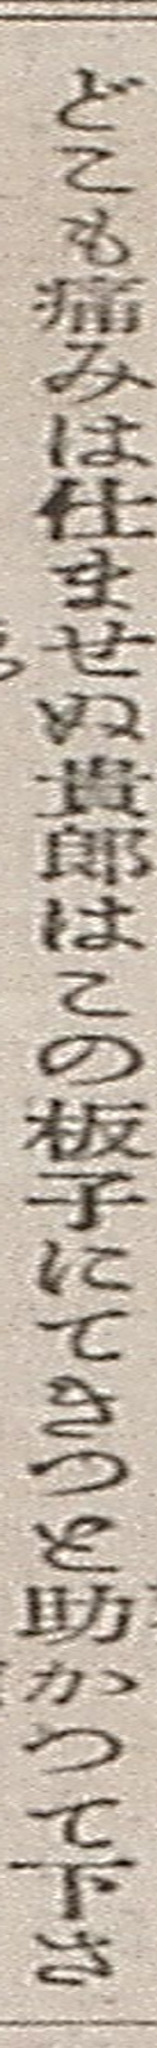どこも痛みは仕ませぬ貴郎はこの板子にてきつと助かつて下さ
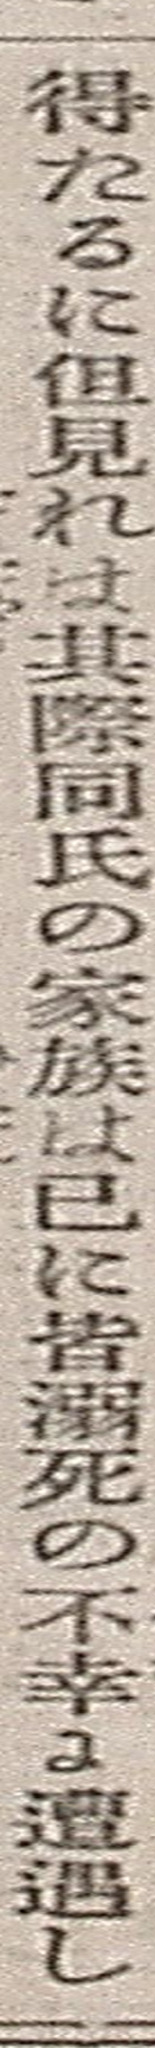得たるに但見れは其際同氏の家族は已に皆溺死の不幸に遭遇し
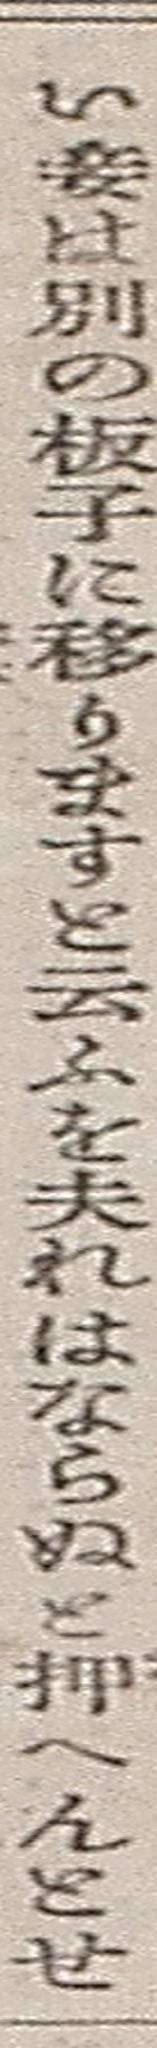い妾は別の板子に移りますと云ふを夫れはならぬと押へんとせ
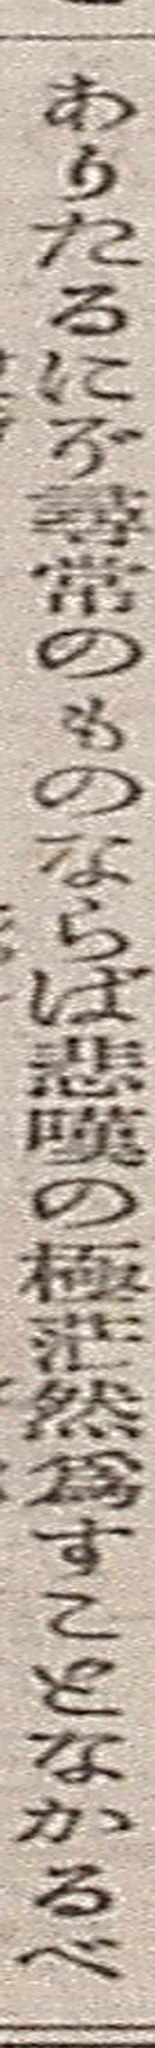ありたるにぞ尋常のものならば悲嘆の極茫然為すことなかるべ
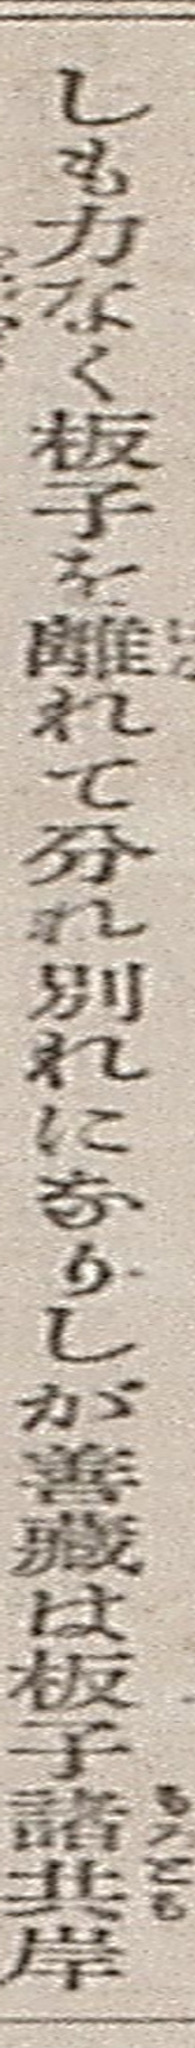しも力なく板子を離れて分れ別れになりしが善蔵は板子諸共岸
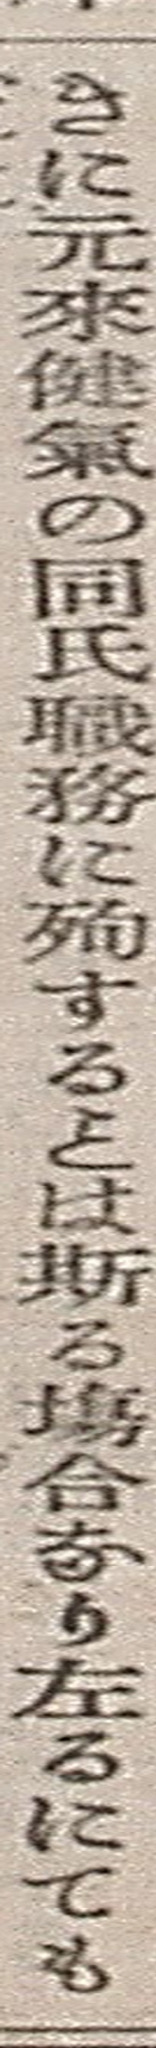きに元来健気の同氏職務に殉することは斯る場合なり左るにても
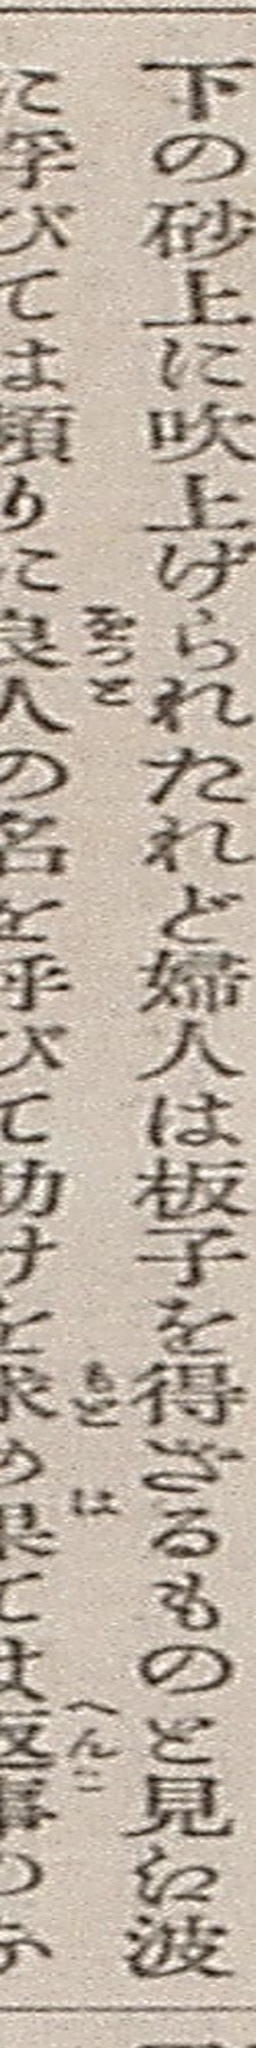に浮びては頻りに良人の名を呼びて助けを求め果ては返事のな
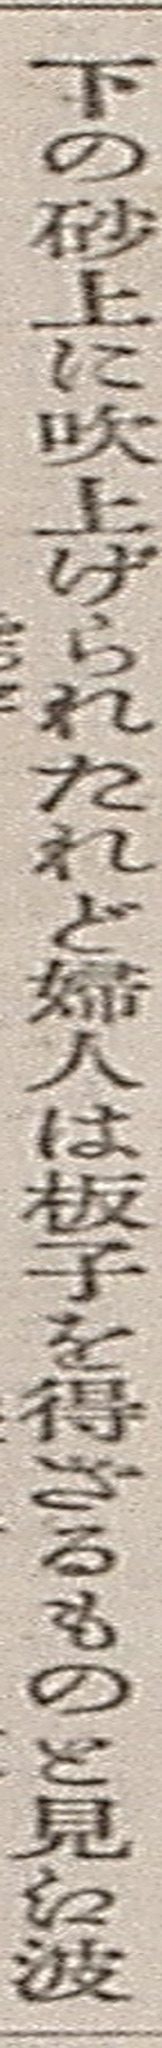下の砂上に吹上げられたれど婦人は板子を得ざるものと見え波
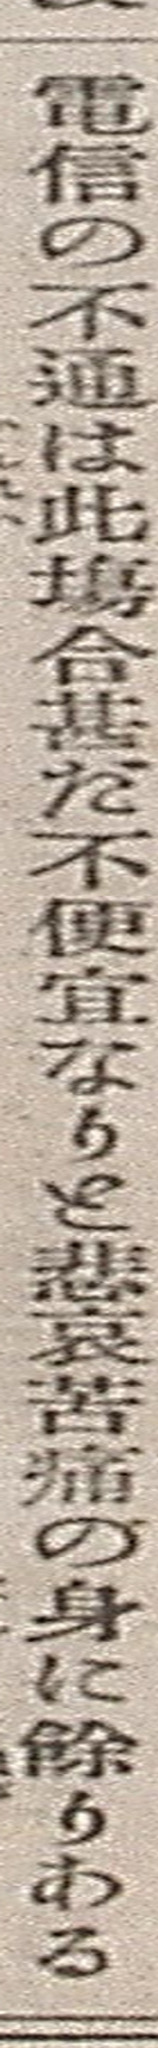電信の不通は此場合甚だ不便宜なりと悲哀苦痛の身に余りある
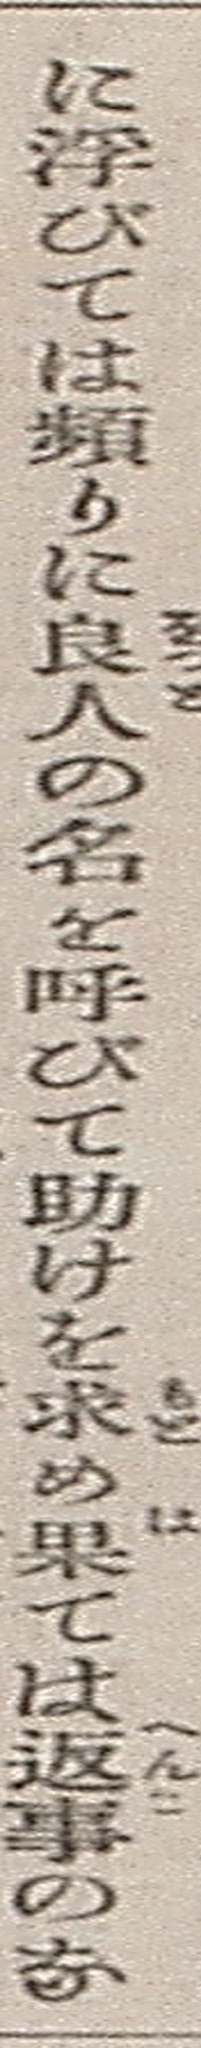に浮びては頻りに良人の名を呼びて助けを求め果ては返事のな
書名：風俗畫報臨時増刊第百十九號　大海嘯被害録（中）
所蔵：東京大学地震研究所図書室 Earthquake Research Institute Library, The University of Tokyo, JAPAN
